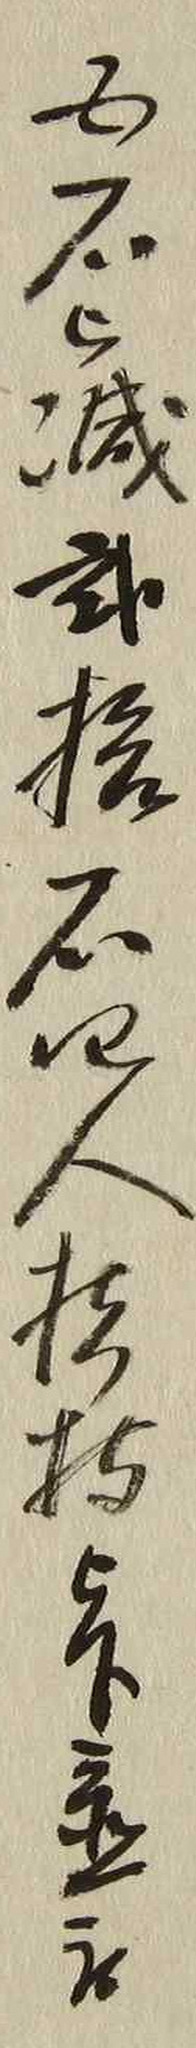五石被減弐拾石四人扶持被下置被
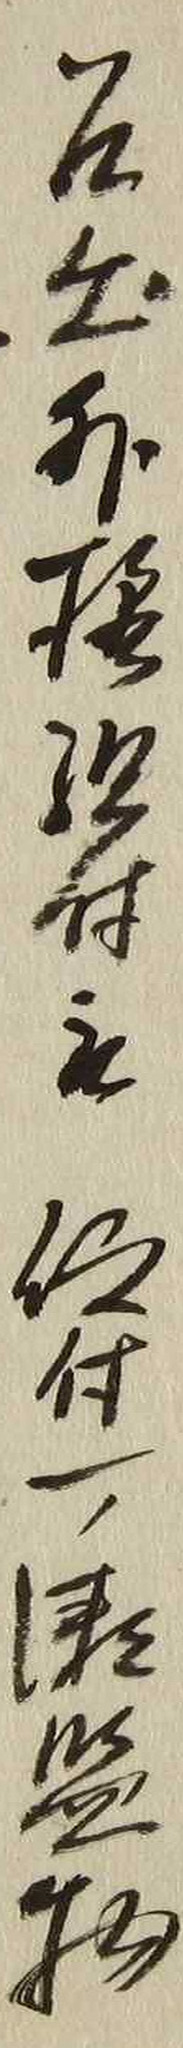召出外様組付被仰付一ノ瀬監物
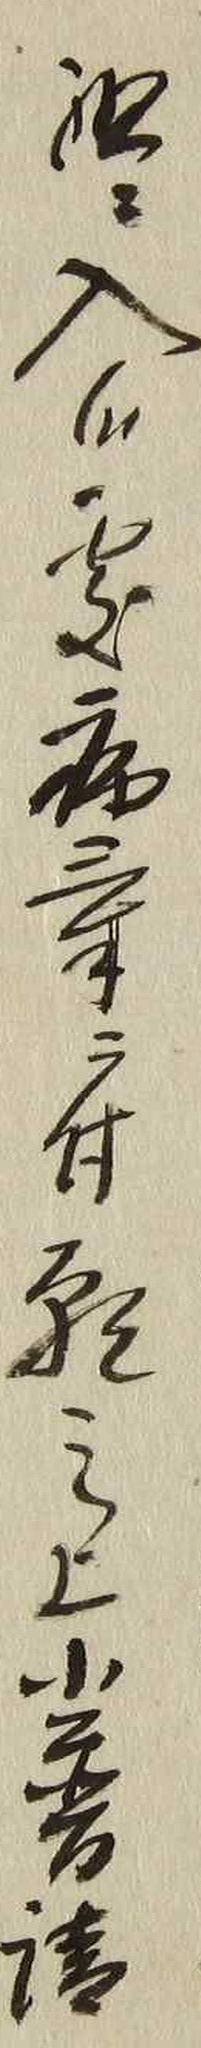組ニ入候処病気ニ付願之上小普請
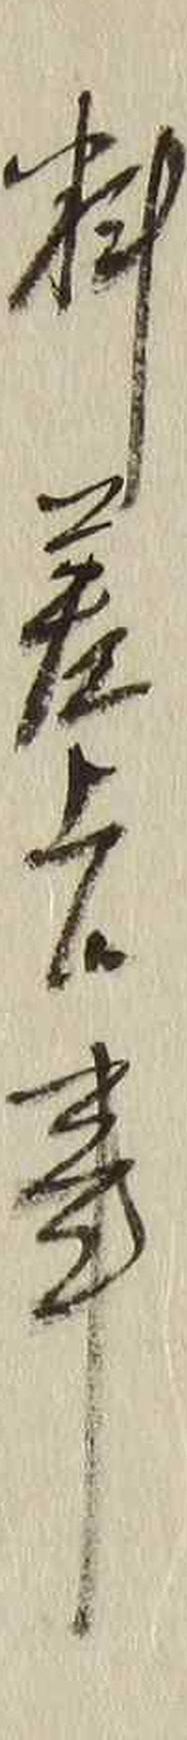料差上候事
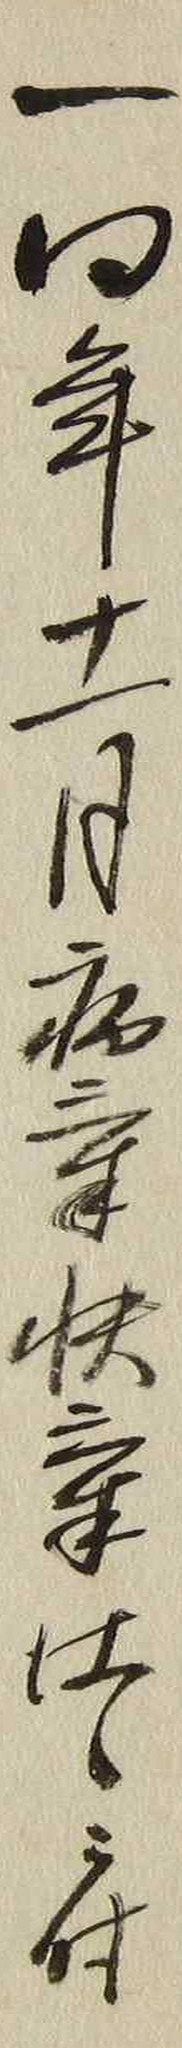一同年十一月病気快気仕候ニ付
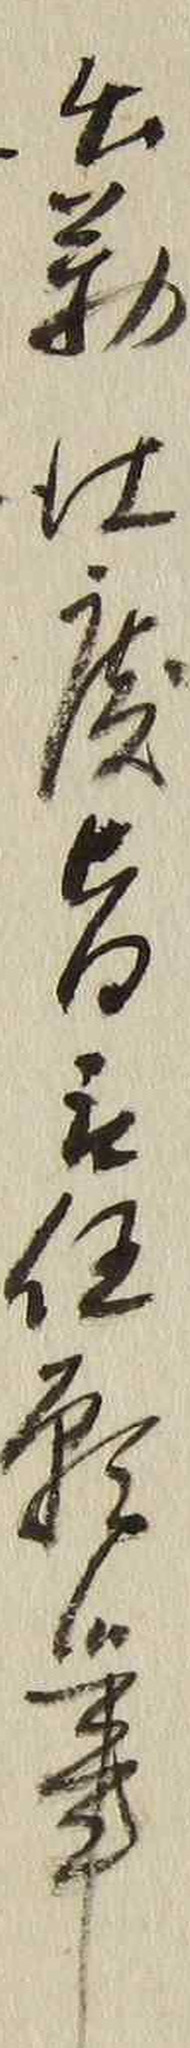出勤仕度旨被任願候事
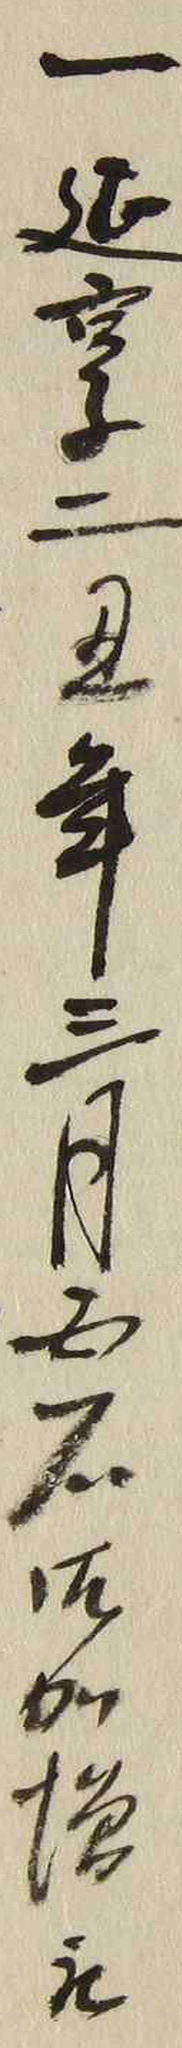一延享二丑年三月五石御加増被
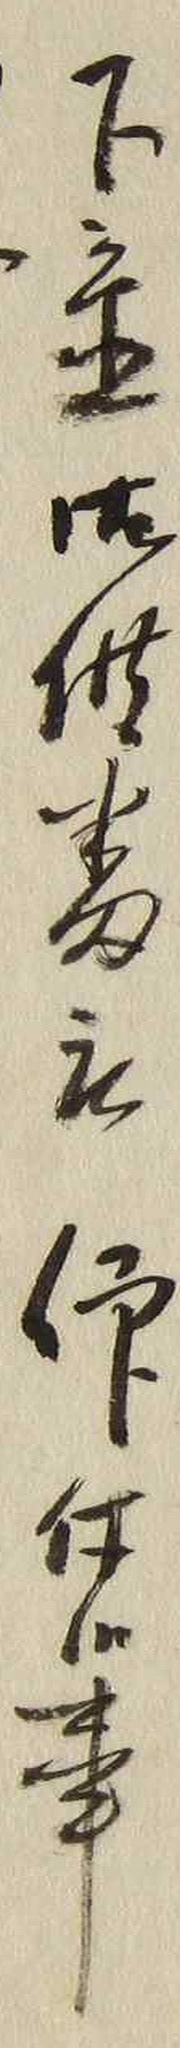下置御供番被仰付候事
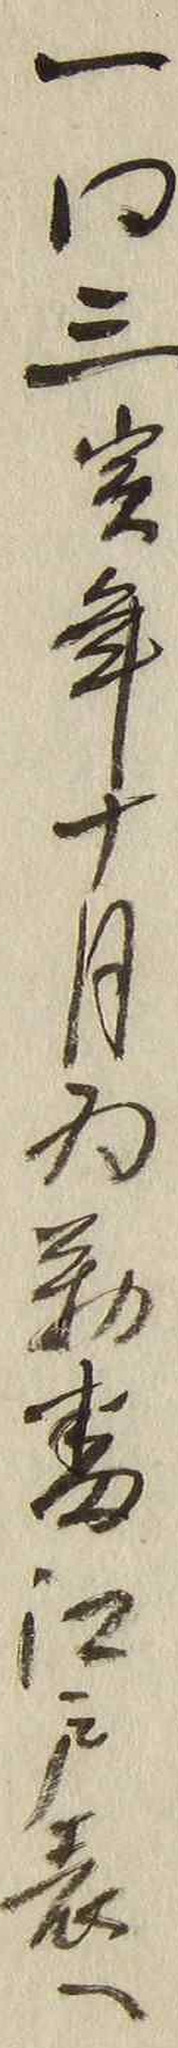一同三寅年十月為勤番江戸表へ

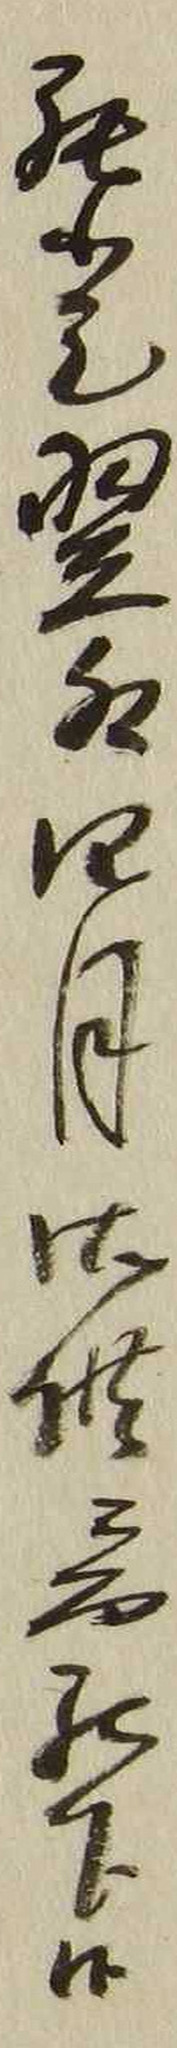罷登翌卯四月御供ニ而罷下候
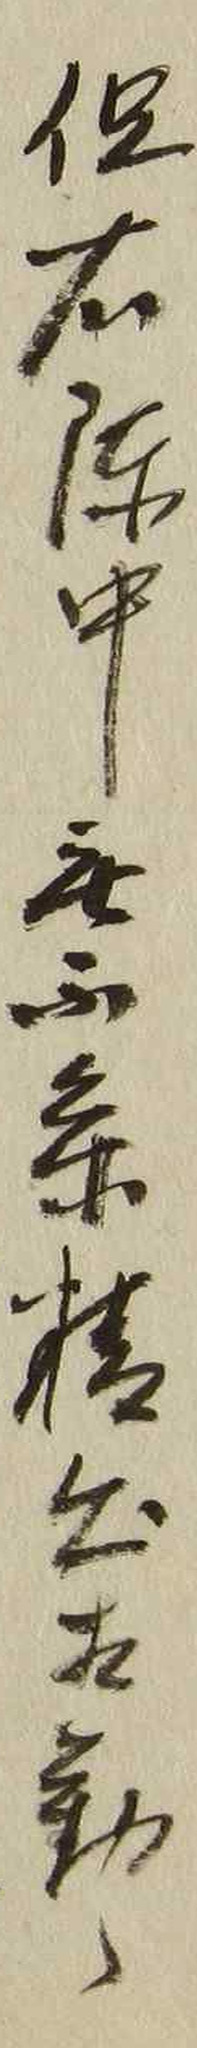但右陣中無不参精出相勤候
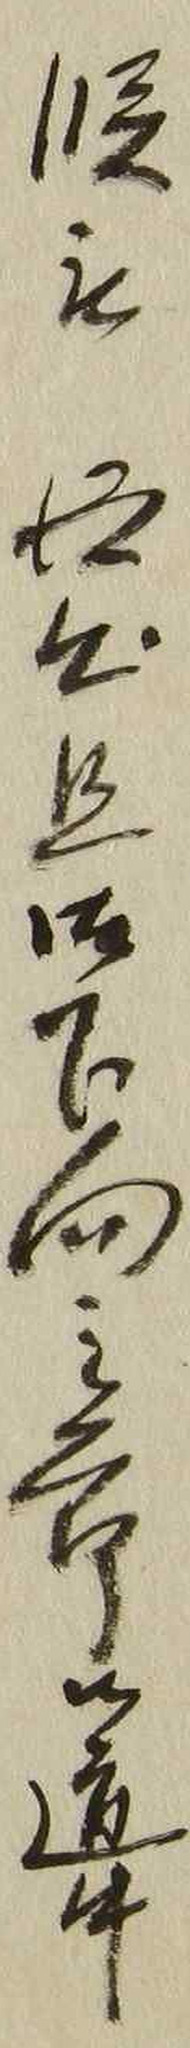段被仰出且御下向之節御道中
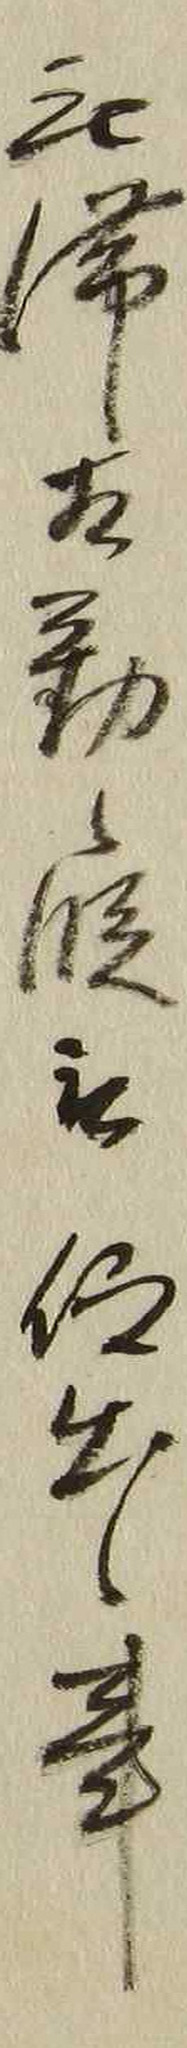無滞相勤候段被仰出候事
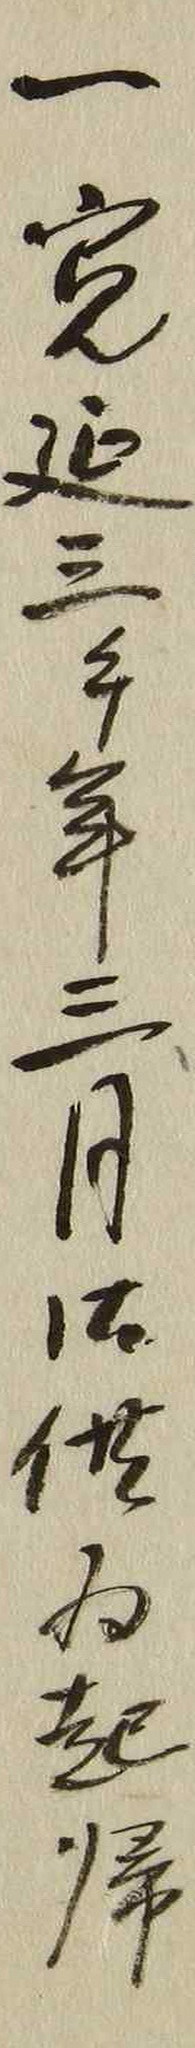一寛延三午年三月御供為起帰
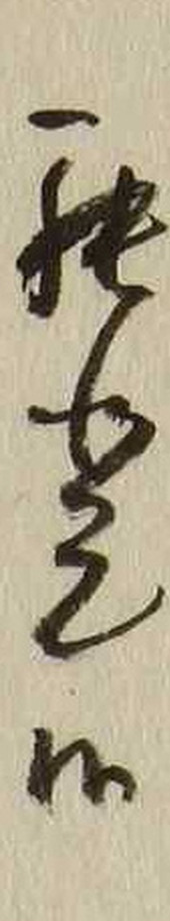罷登候
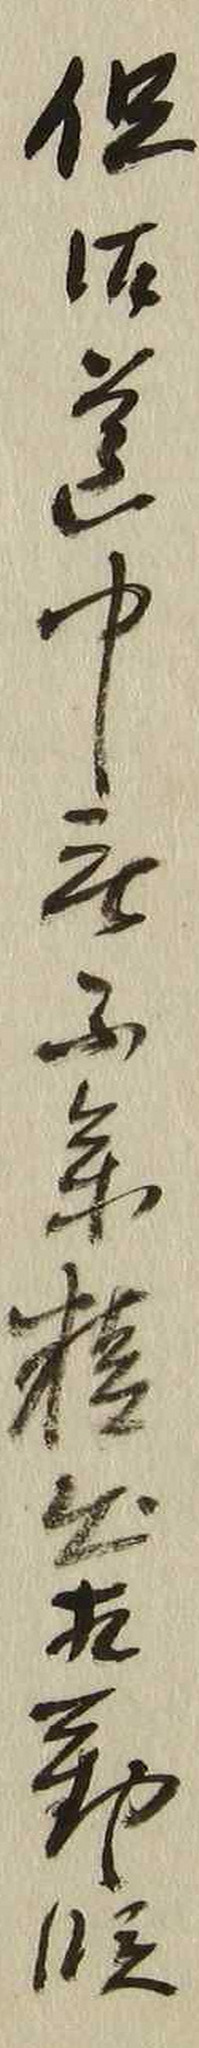但御道中無不参精出相勤候段
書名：諸士系譜　巻之359　す之部9
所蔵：会津若松市立会津図書館
